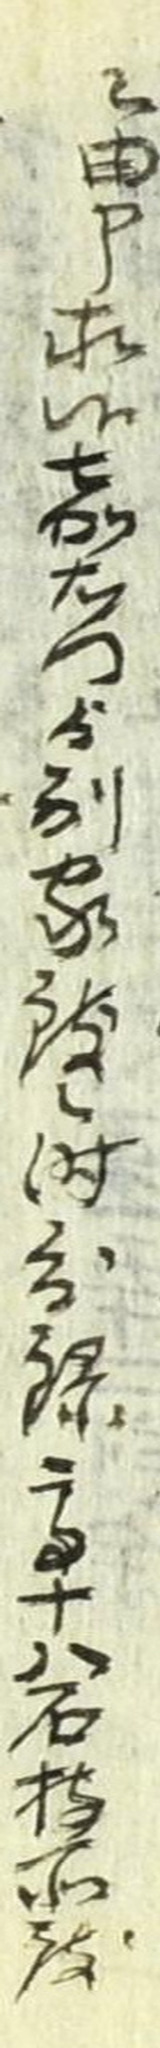候由申述候嘉左衛門ゟ別家致候時分録高十八石持所致
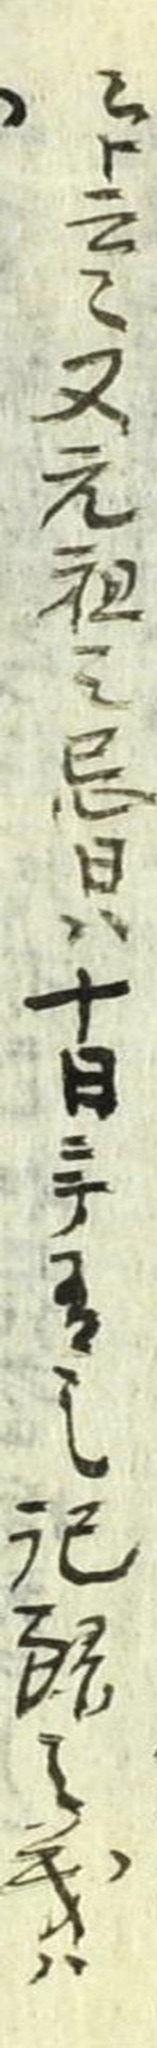候ト云々又元祖之忌日ハ十日ニテ有之記録之義ハ
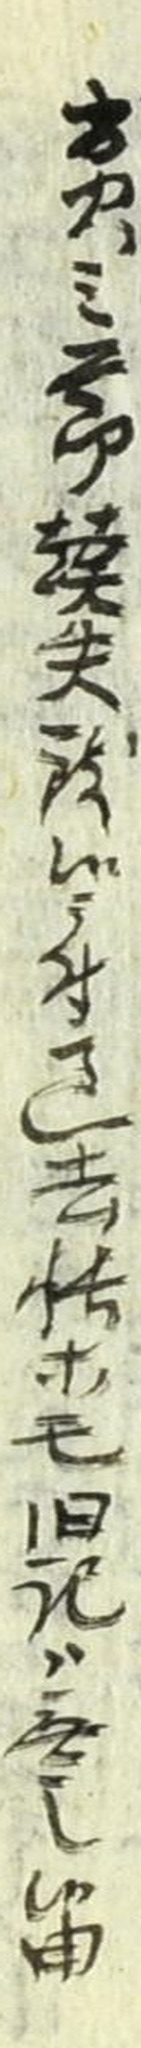出火之節焼失致候ニ付過去帳等モ旧記ハ無之候由
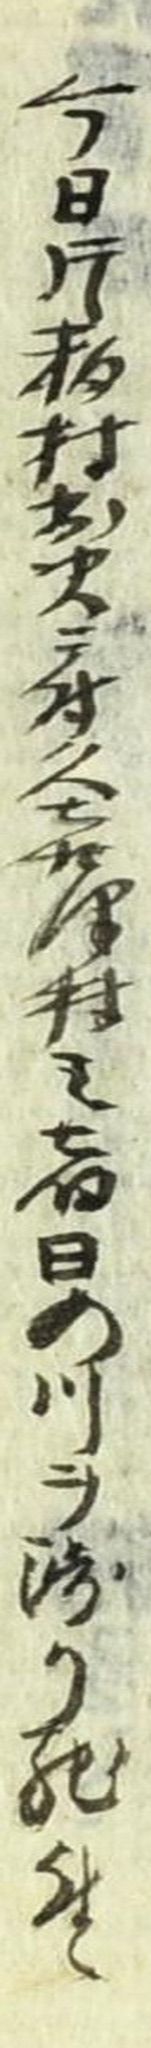今日片粕村出火ニ付久喜津村之者日の川ヲ渉り馳付候
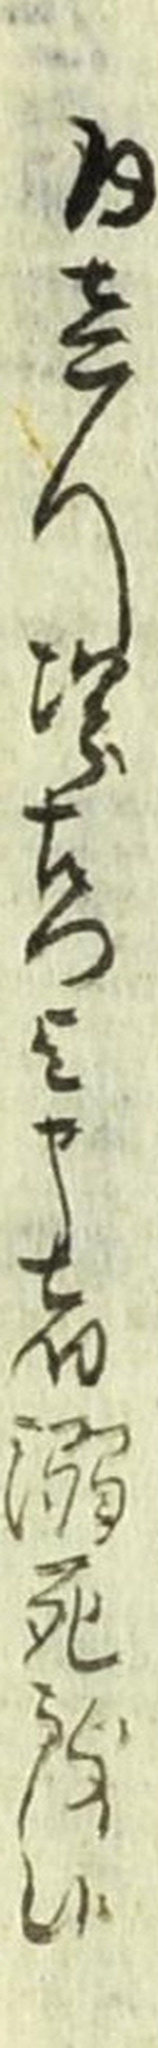内壱人次郎左衛門与申者溺死致候
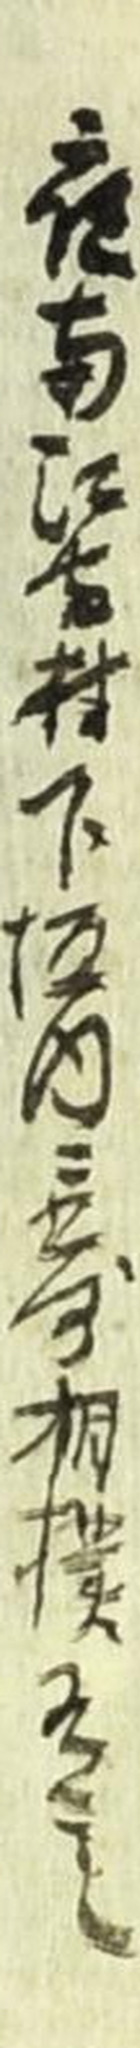夜南江守村下垣内に寄相撲有之
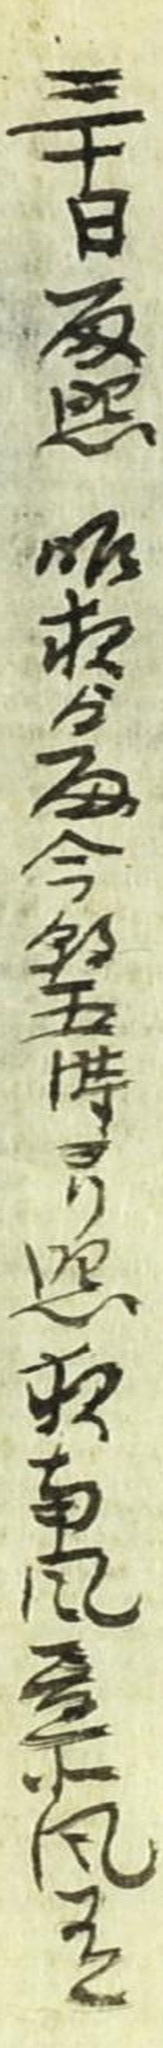三十日雨照昨夜ゟ雨今朝五時ヨリ照夜南風昼北風有
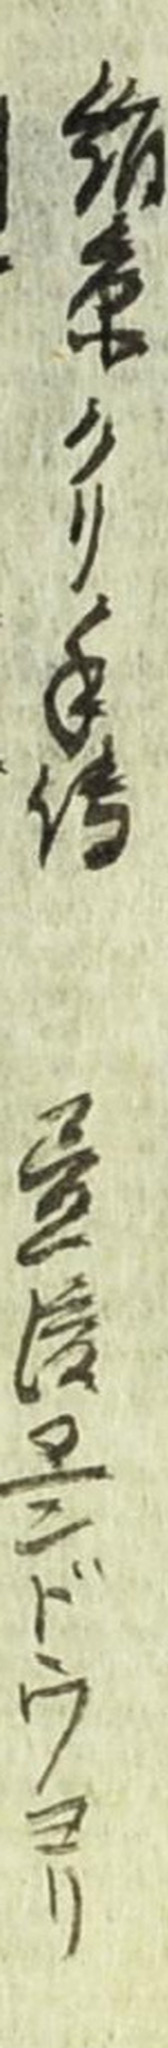絹糸クリ手伝昼後ヱンドウヨリ
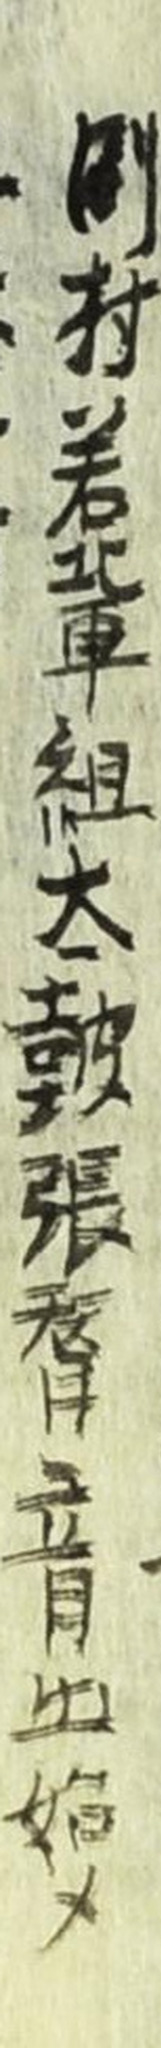淵村若輩組太鼓張替音出始メ
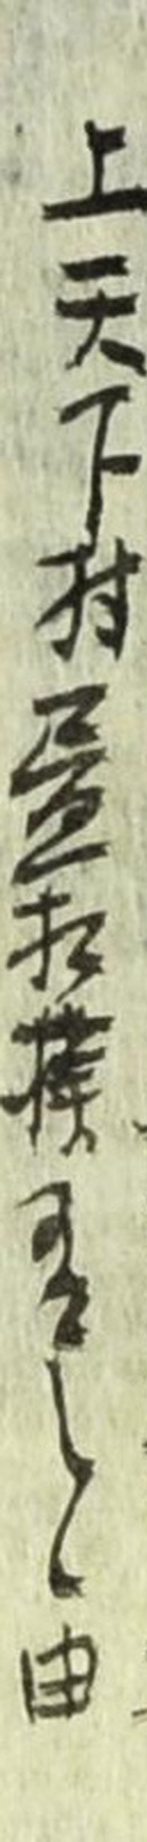上天下村昼相撲有之由
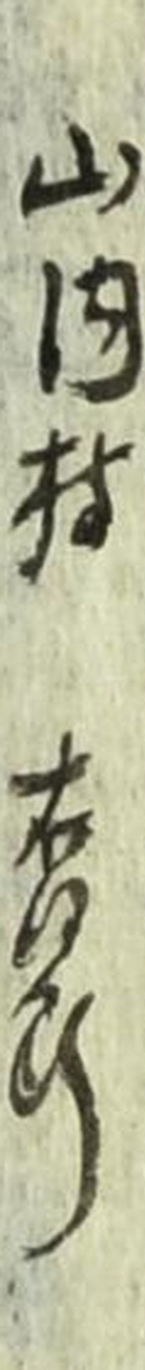山内村右同断
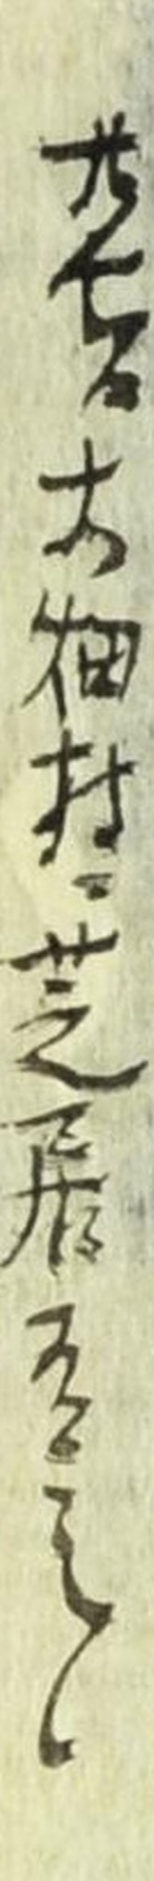廿七日大畑村に芝居有之候
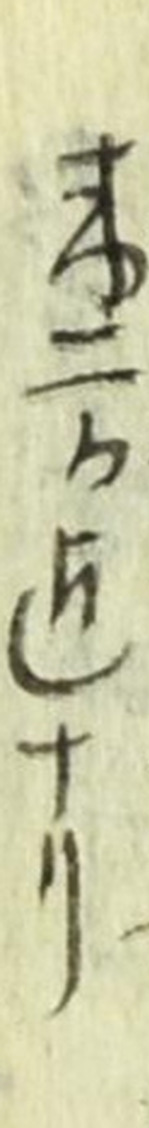来二日迄ナリ
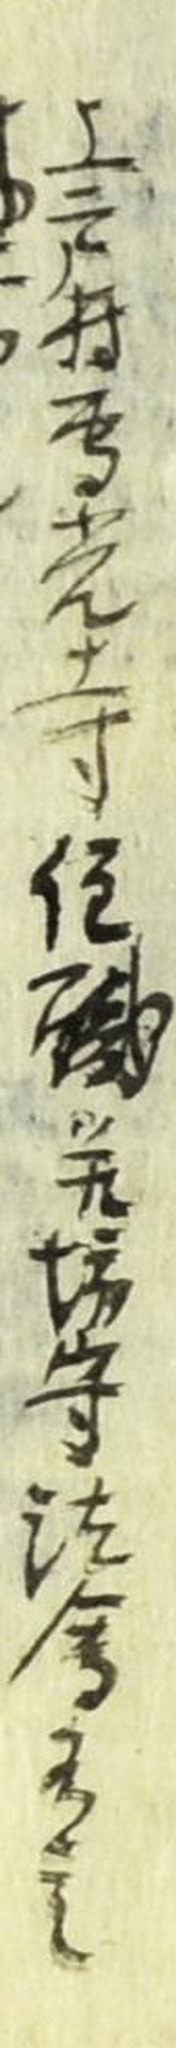上戸村専光寺住職幷坊守法会有之

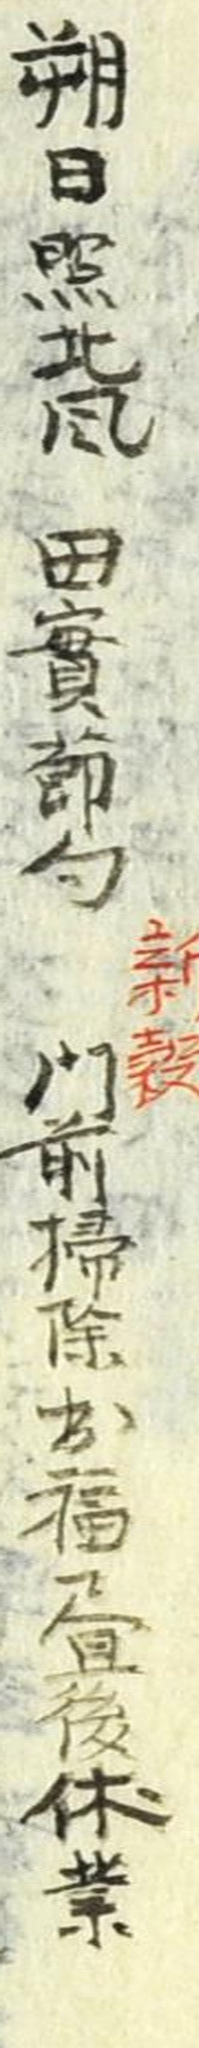○朔日照北風田実節句門前掃除出福昼後休業
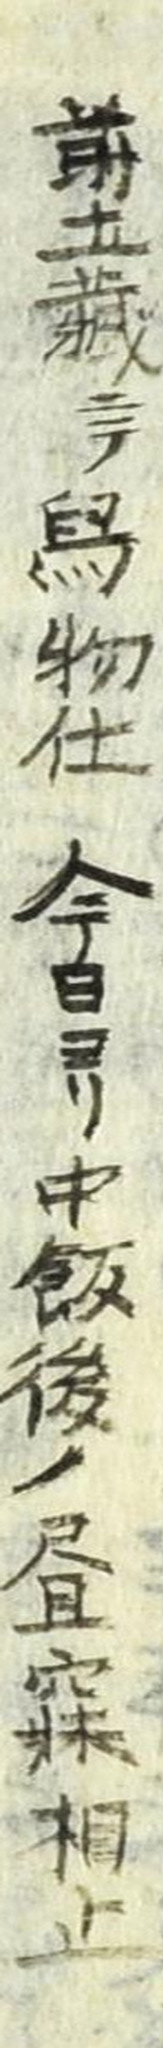△前土蔵ニテ写物仕今日ヨリ中飯後ノ昼寝相止
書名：（日記）
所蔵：福井県文書館 Fukui Prefectural Archives
